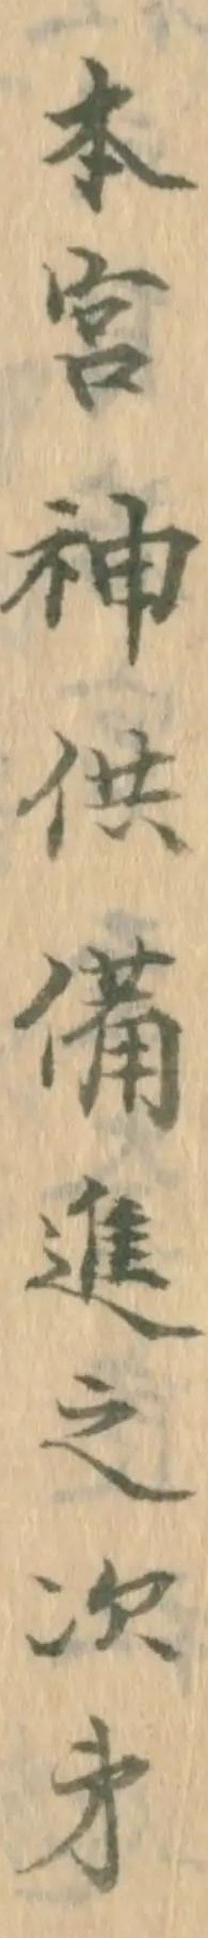本宮神供備進之次第
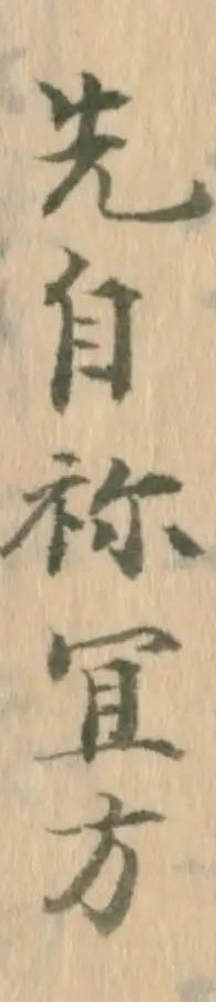先自禰宜方

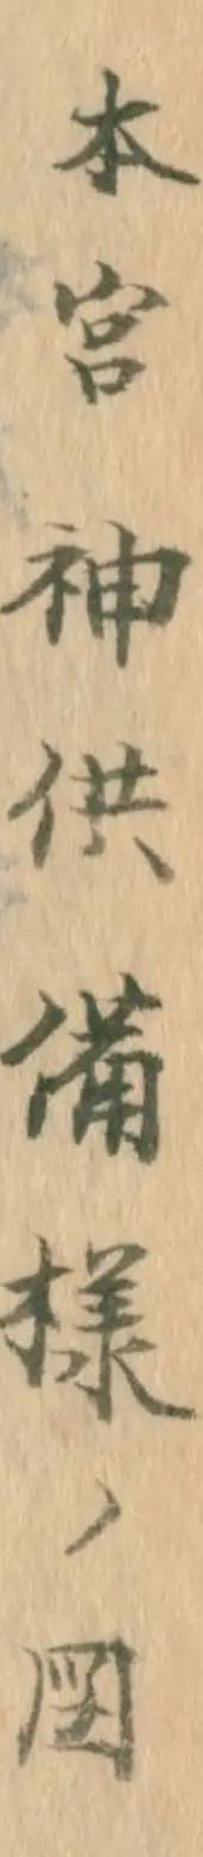本宮神供備様ノ図
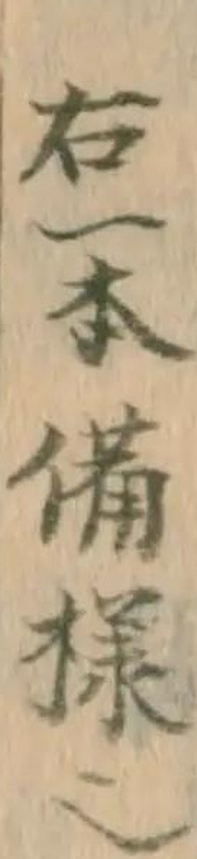右一本備様也
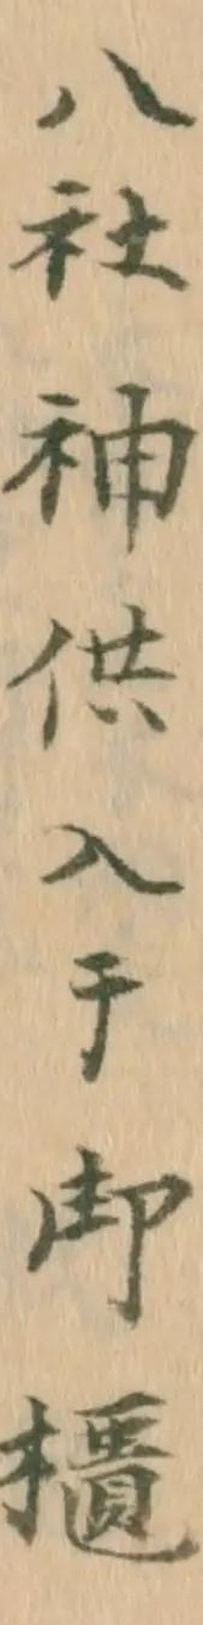八社神供入于御櫃
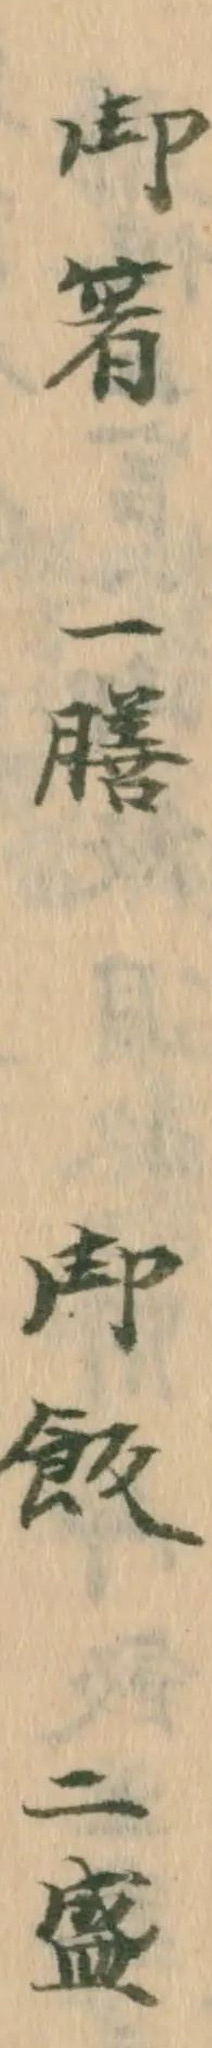御箸一膳御飯二盛
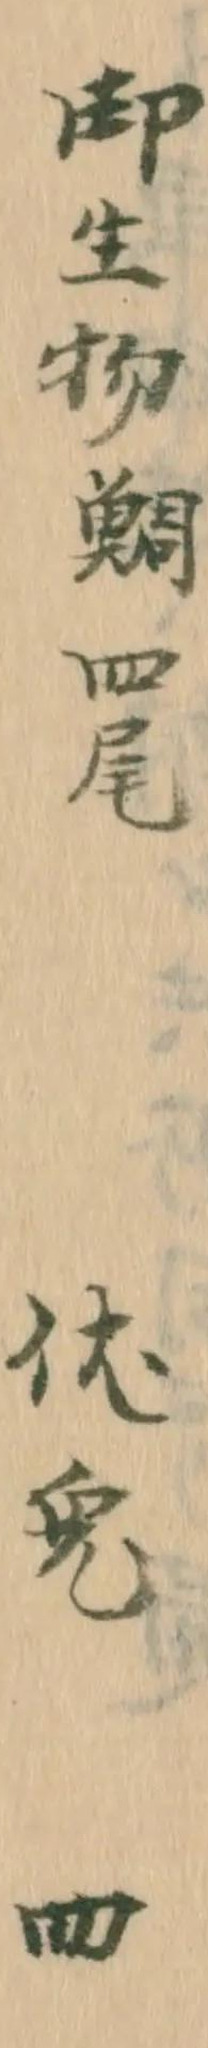御生物鯛四尾伏兎四
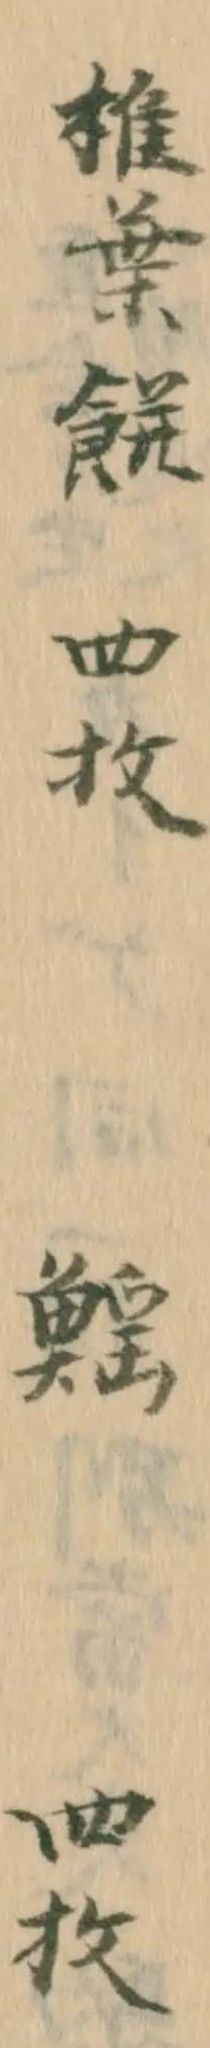椎葉餅四枚鰩四枚
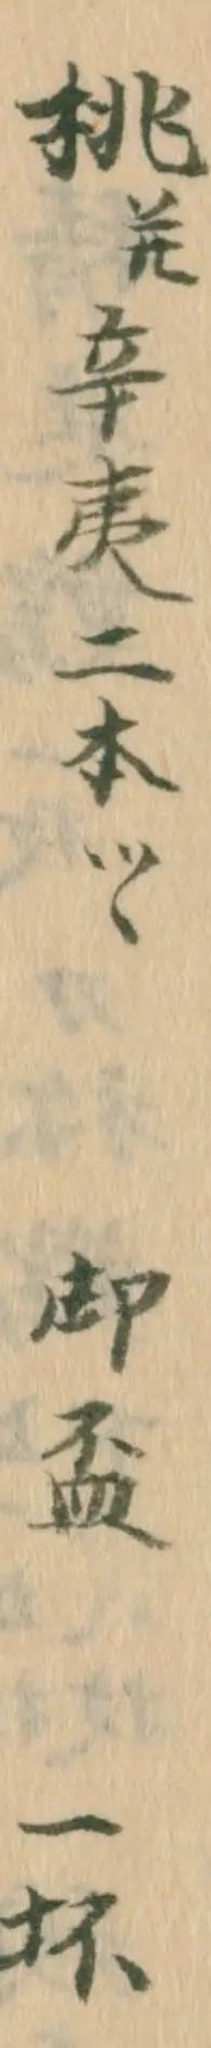桃并辛夷二本ツヽ御盃一坏

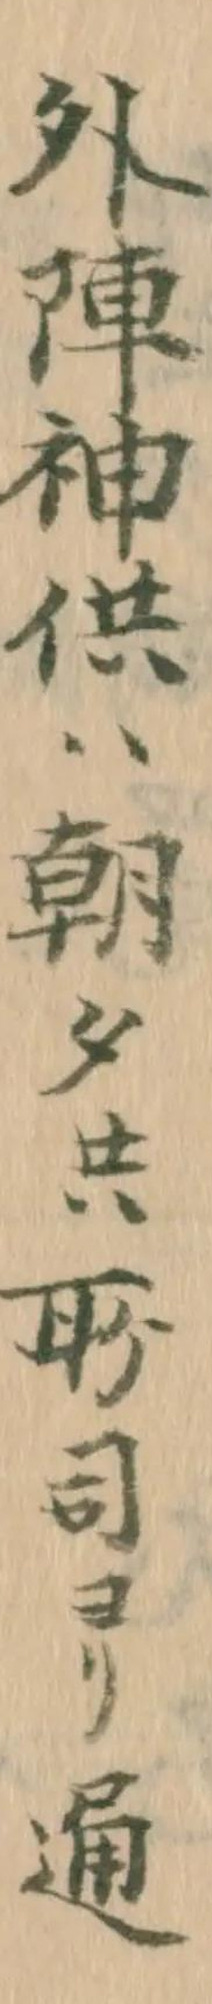外陣神供ハ朝夕共所司ヨリ通
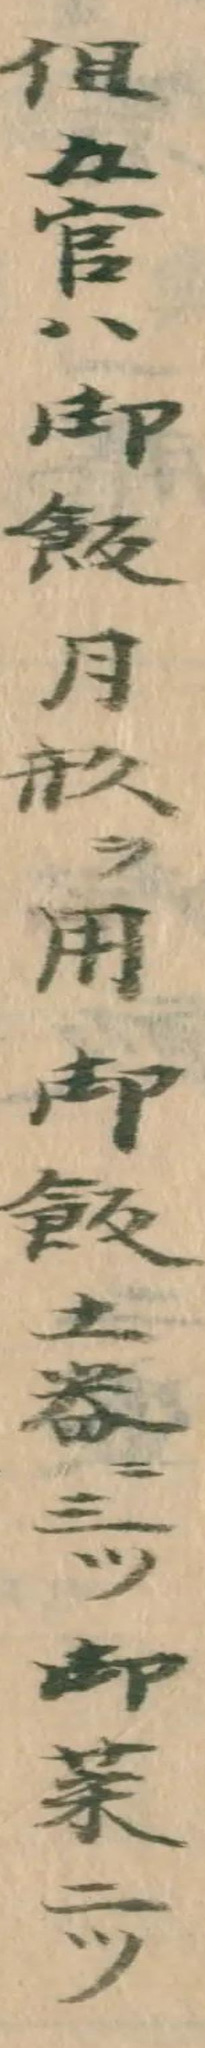但五官ハ御飯月形ヲ用御飯土器ニ三ツ御菜二ツ
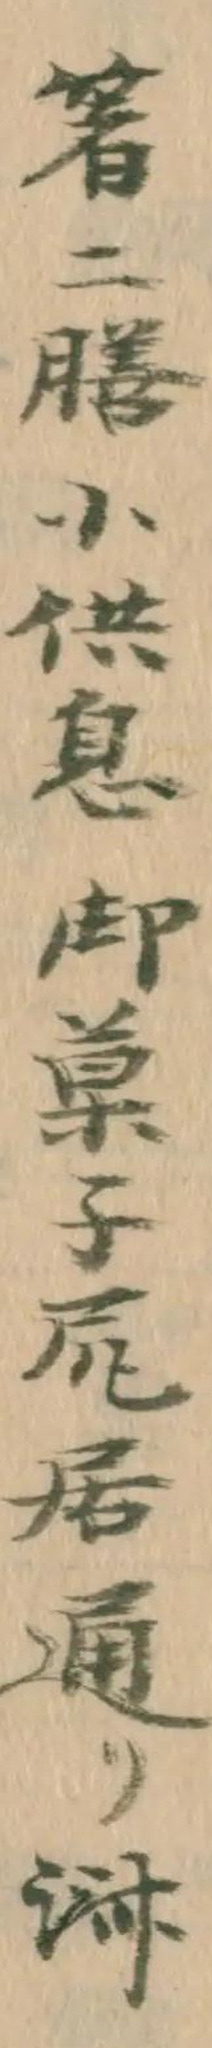箸二膳小供息御菓子尻居通リ済
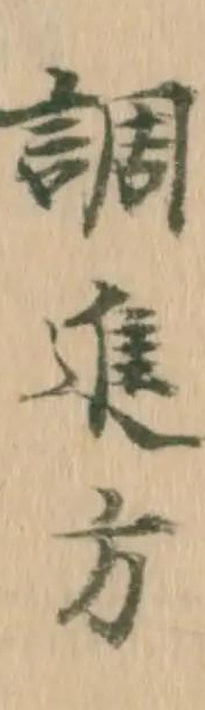調進方

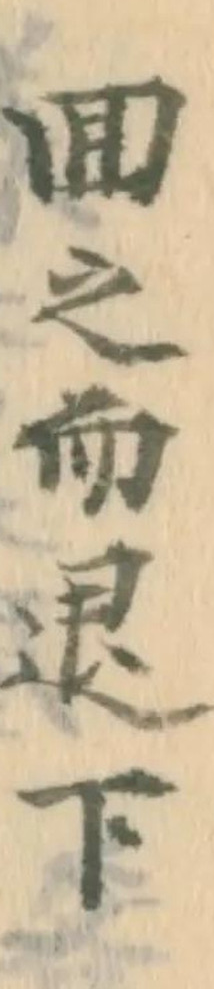回之扁退下
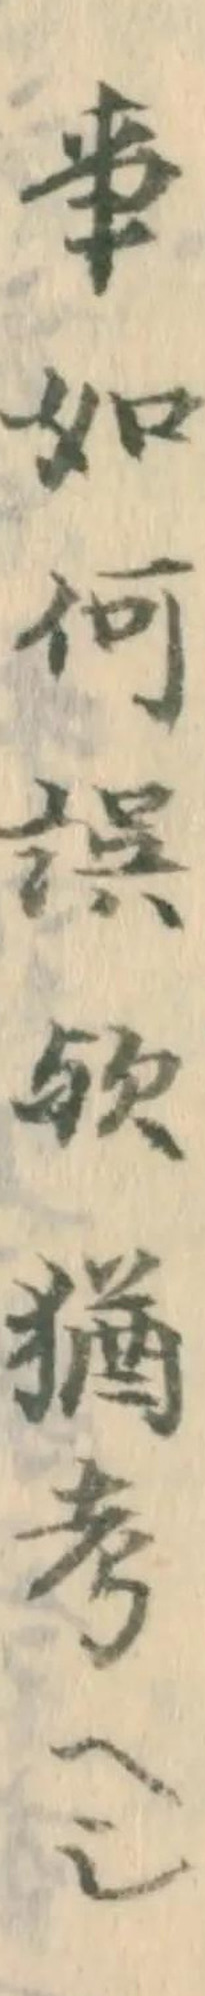事如何誤歟猶考ヘシ
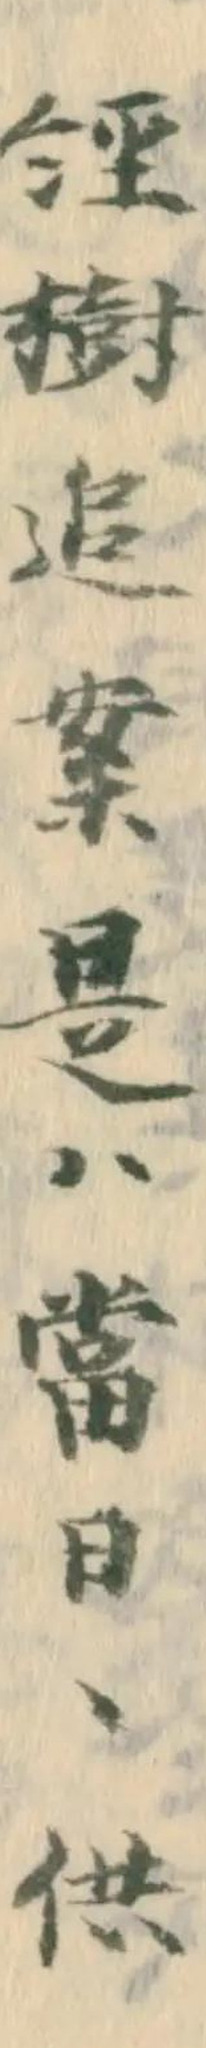経樹追案是ハ当日々供
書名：賀茂社記録. 第5冊
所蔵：国立国会図書館 National Diet Library, JAPAN
